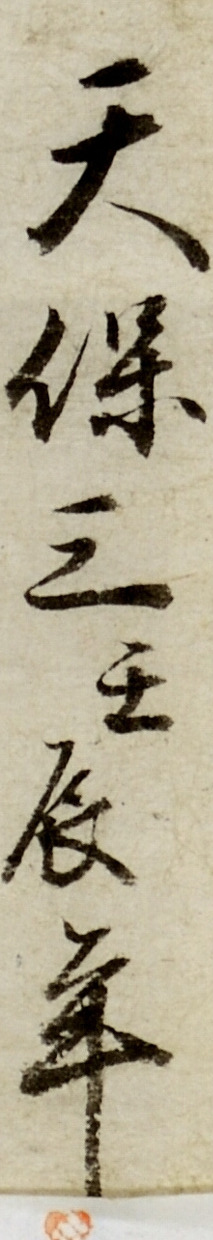天保三壬辰年
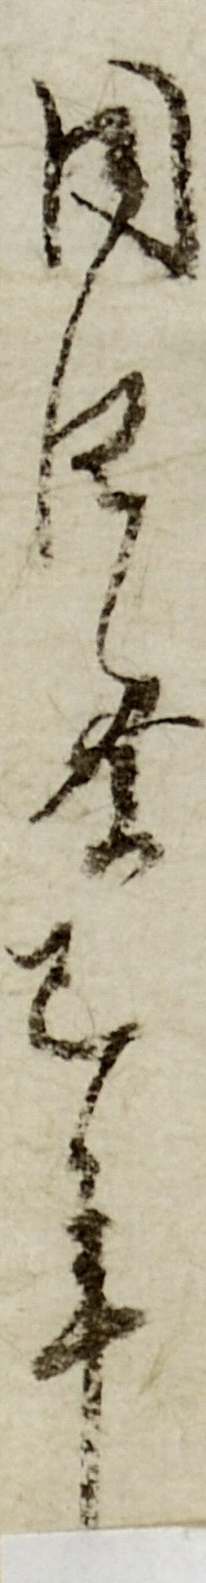同四癸巳年
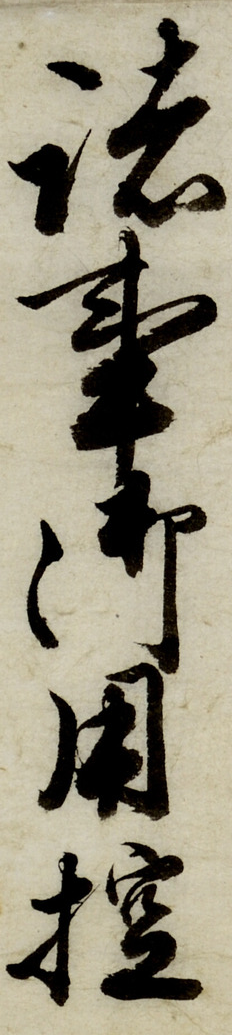諸事御用控
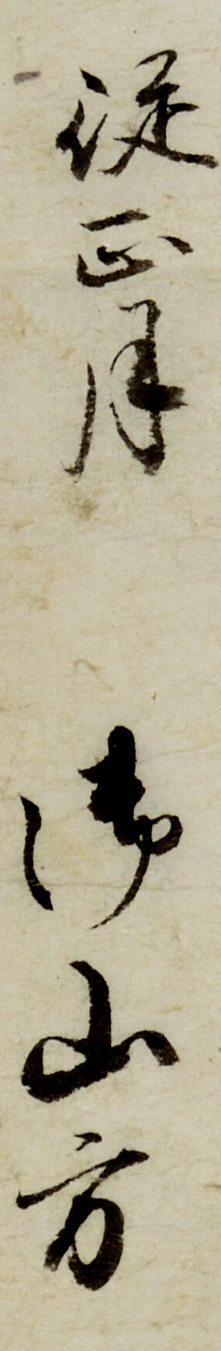従正月御山方
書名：諸事御用控
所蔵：伊那市立高遠町図書館・合同会社AMANE
